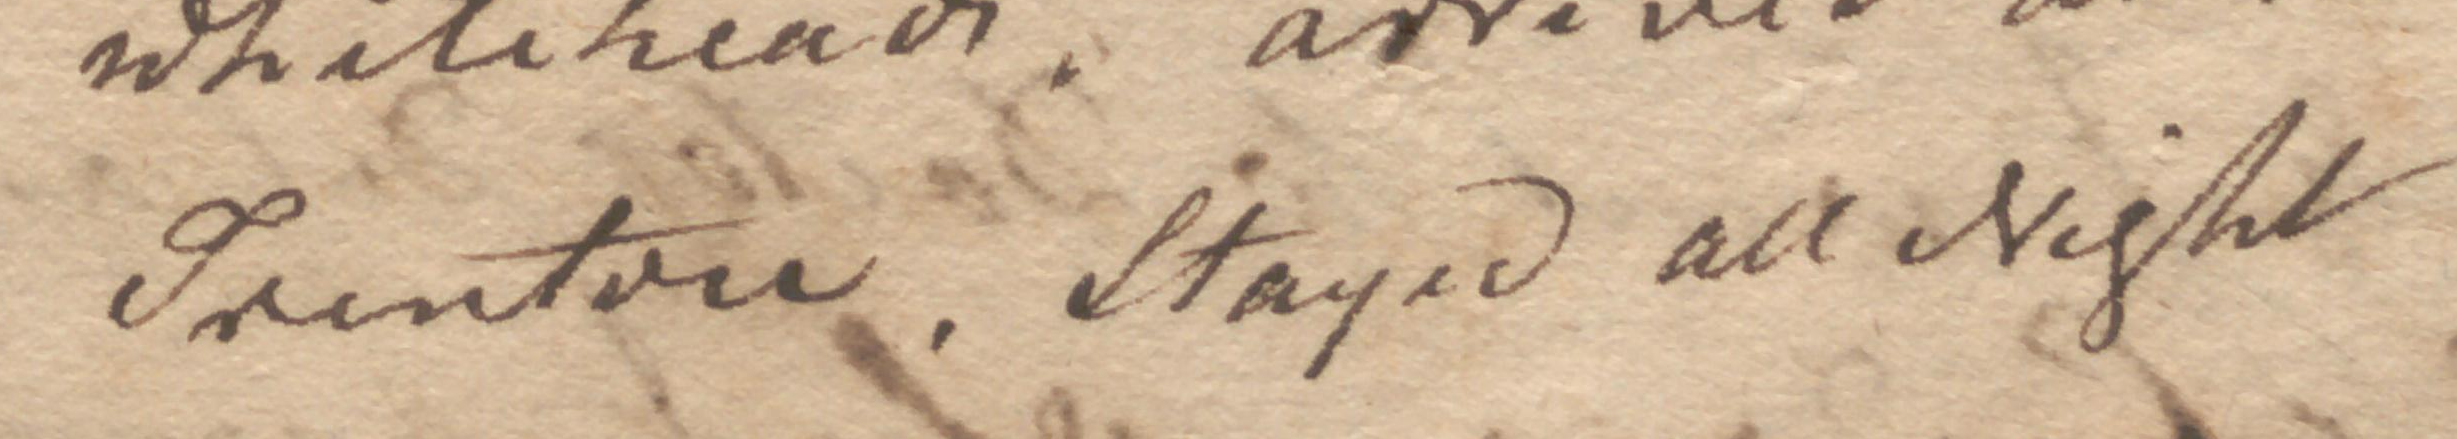Trenton, Stayed all Night
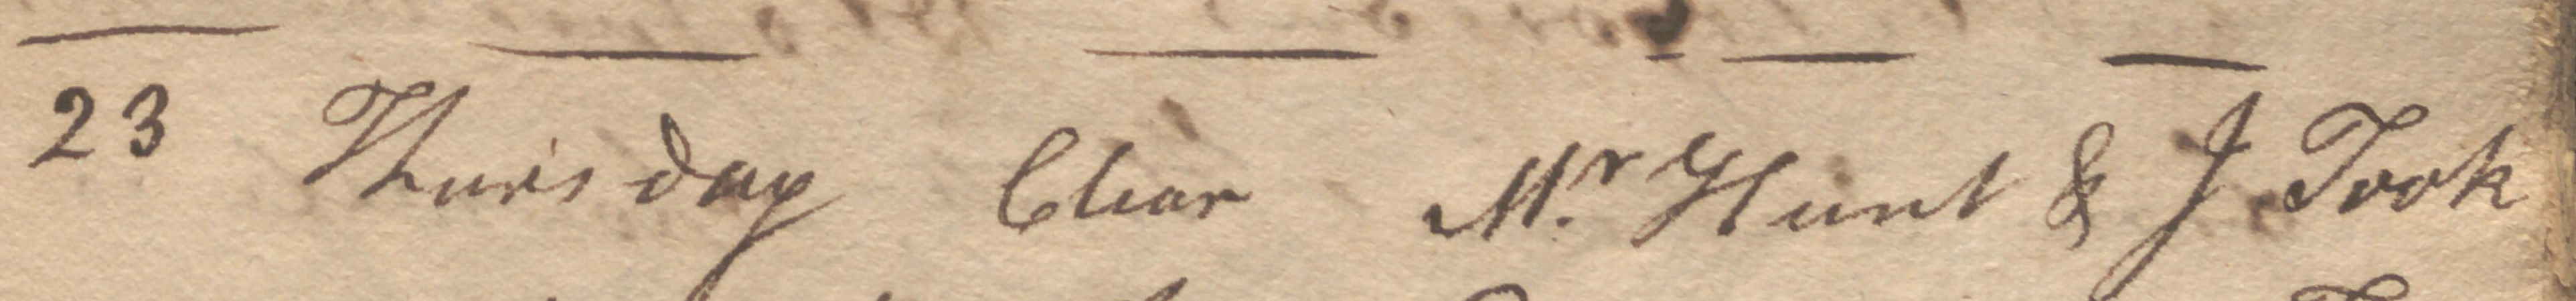23 Thursday Clear M^r. Hunt & I Took
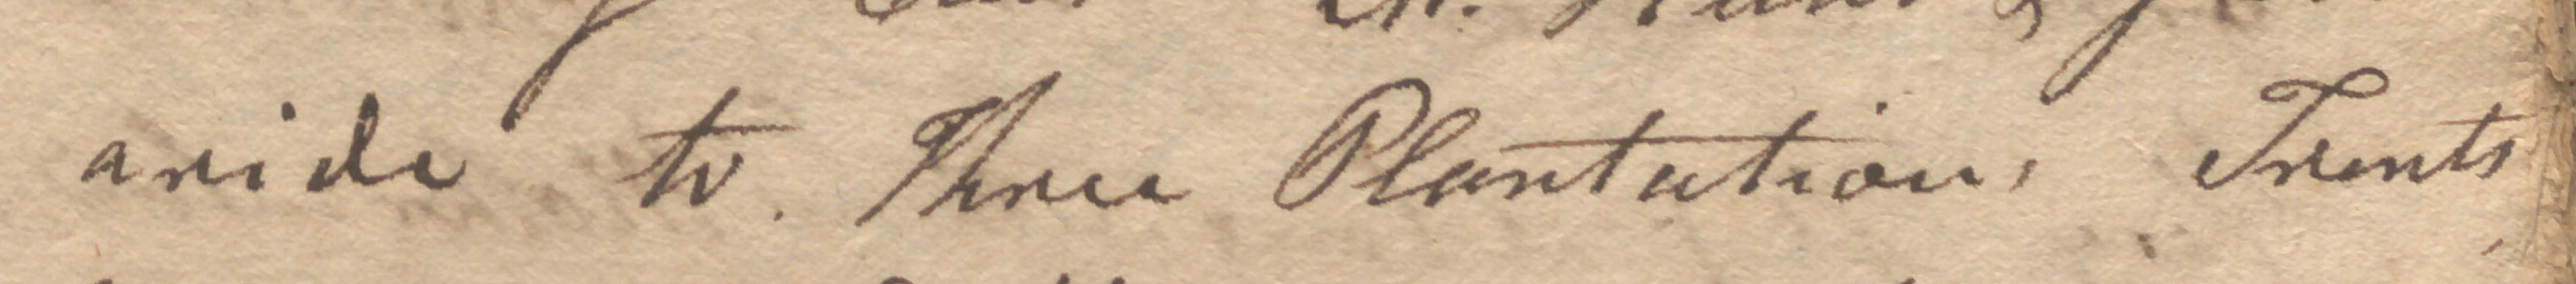a ride to Three Plantations Trents
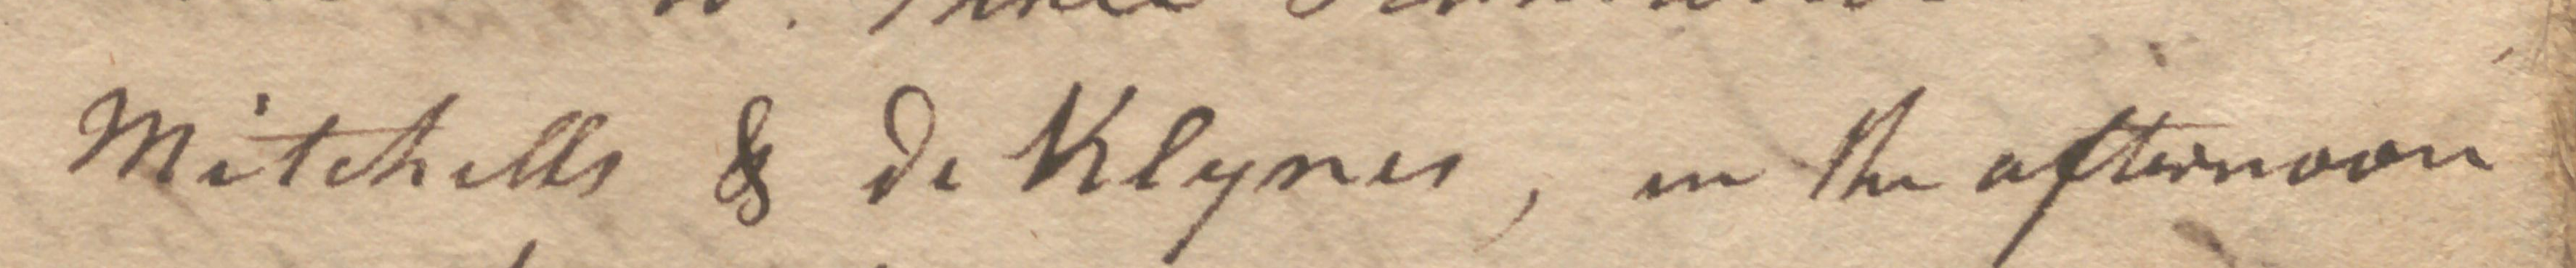Mitchells & diKlynes, in the afternoon
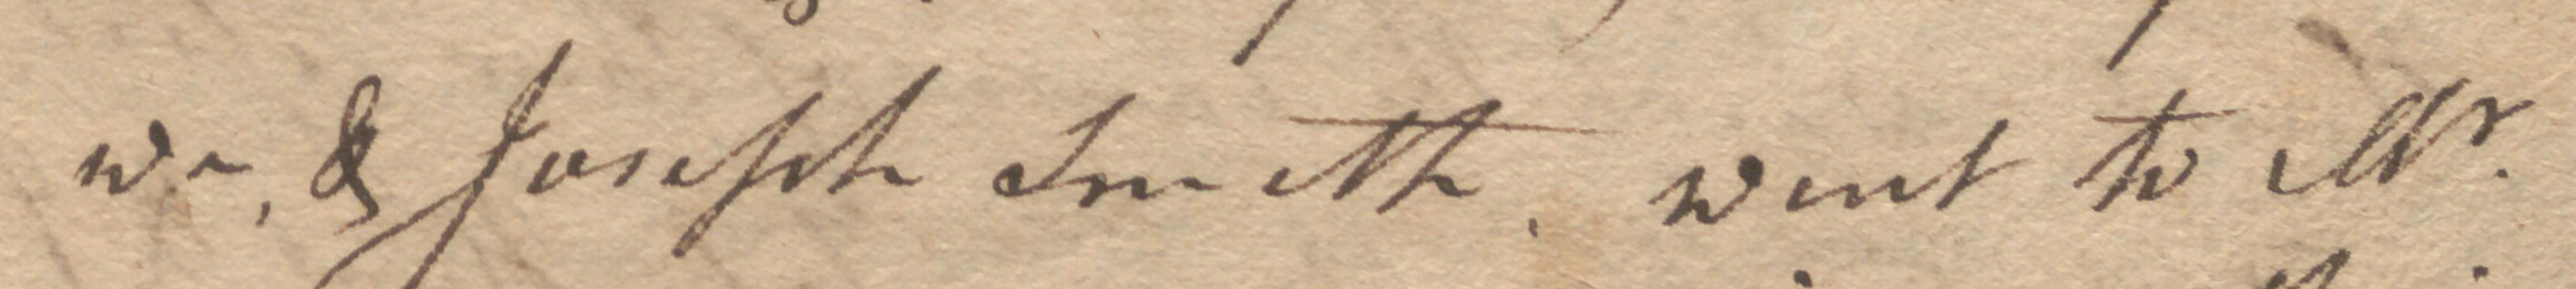we & Joseph Smith went to M^r.
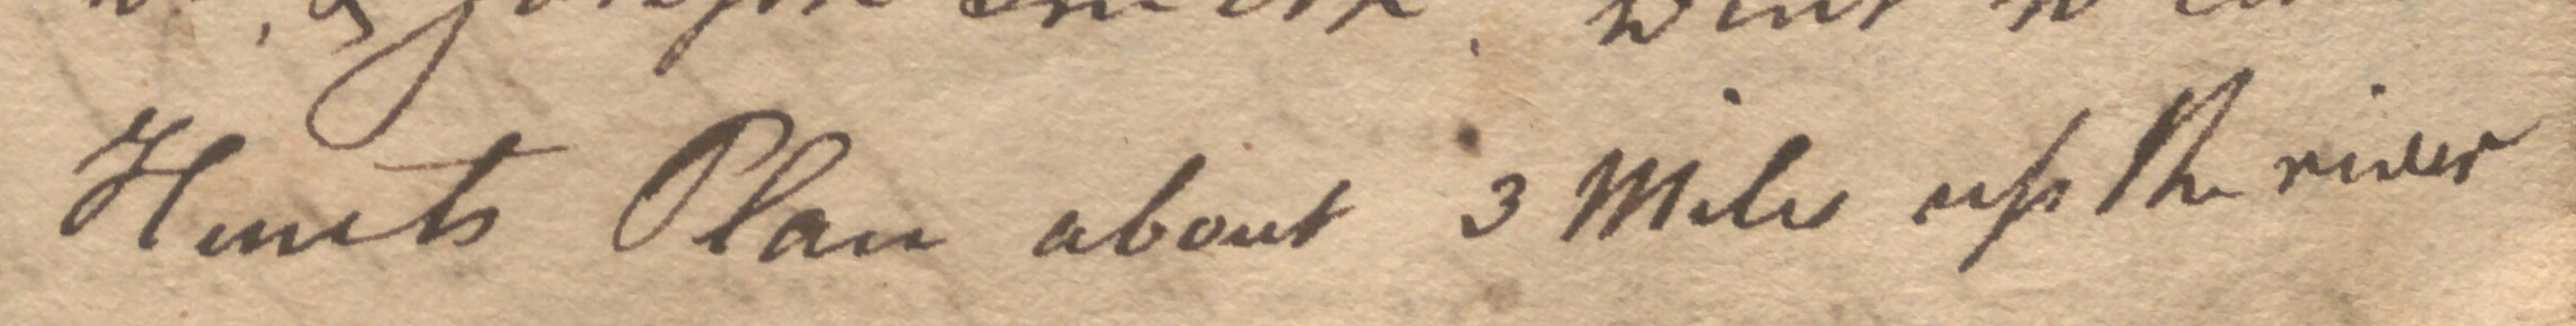Hunts Place about 3 Mile up the river
